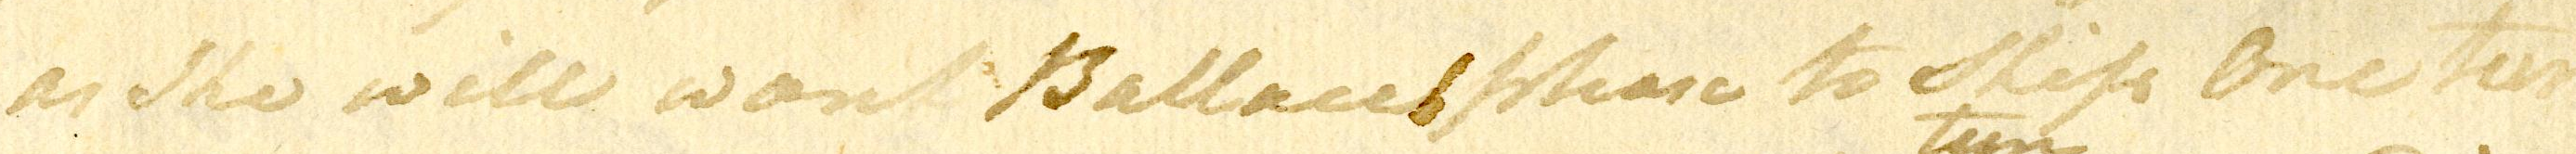as she will want Ballaces please to Ships One for
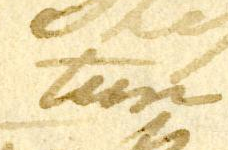tun
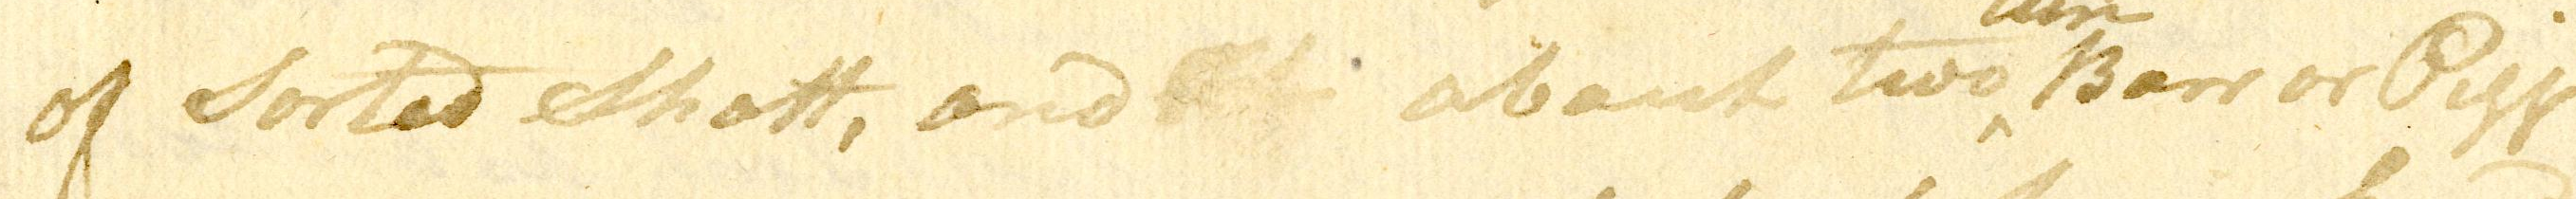of Sorted shott, and about two ^ Barr or Pigg
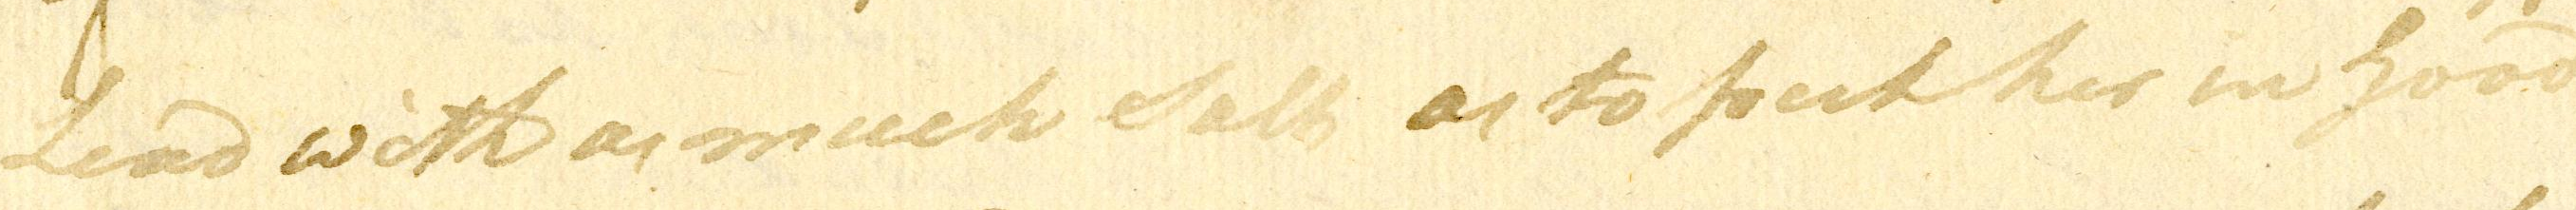Lead with as much salt as to put her in good
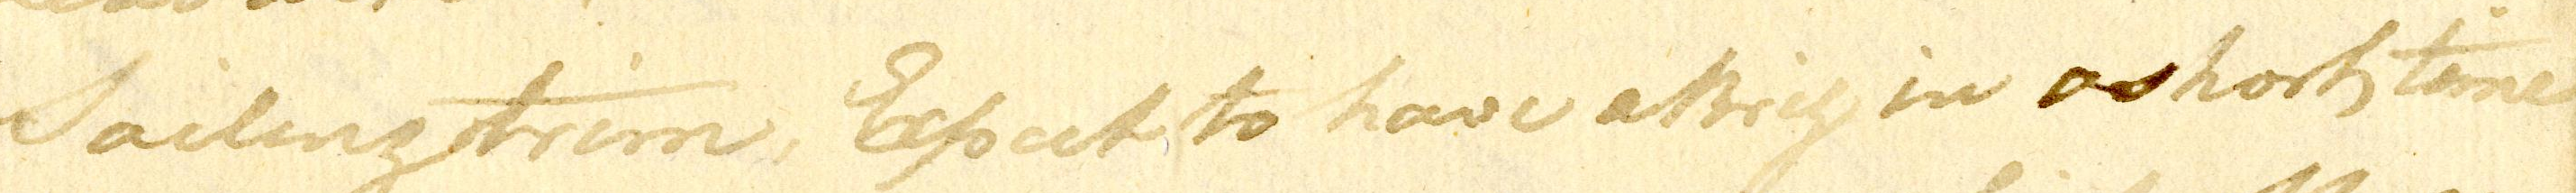Sailing trim, Expect to have a brig in a short time
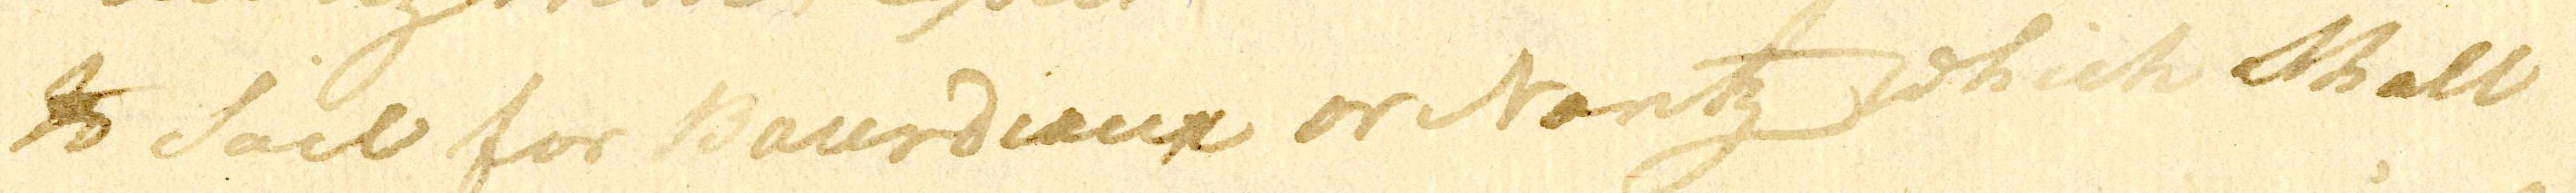to sail for Bourdeaux or Nantz which shall
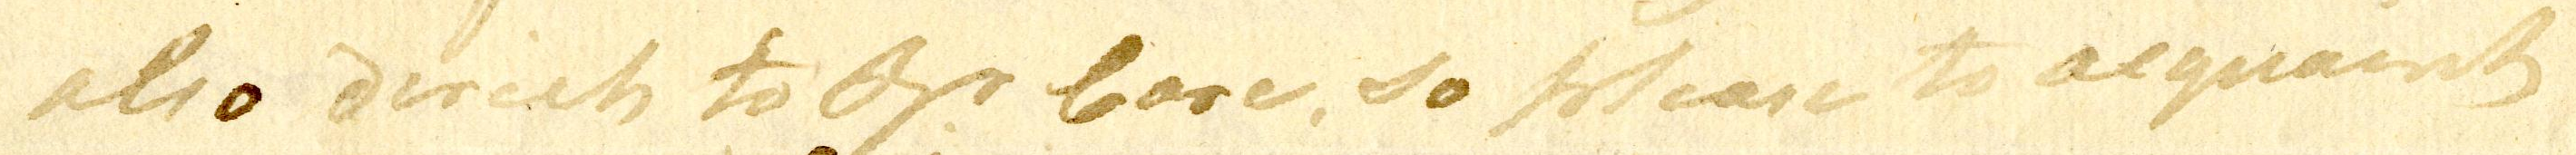also direct to y^r care, so please to acquaint
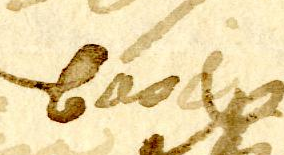case
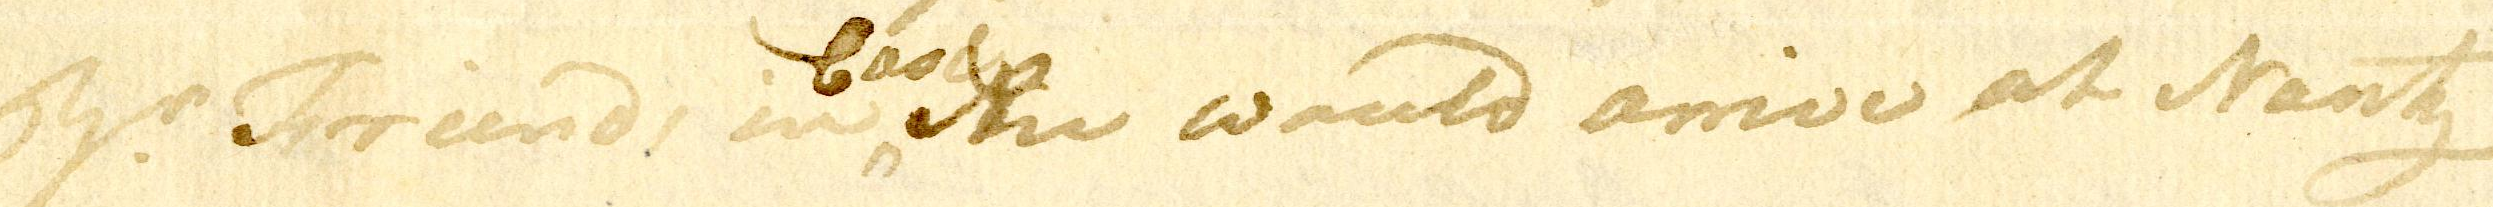y^r. Friends in ^ she would arrive at Nantz
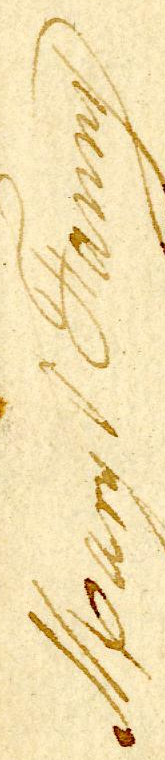Mary & Fanny
